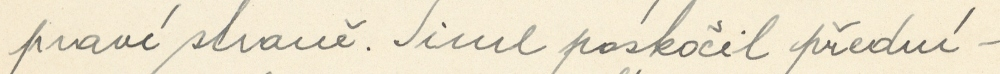pravé straně. Šiml poskočil přední-
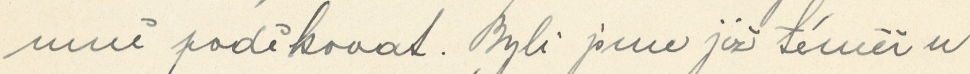mně poděkovat. Byli jsme již téměř u
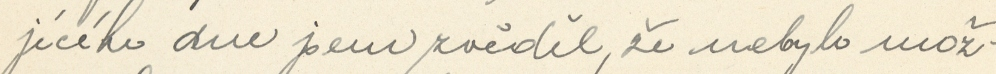jícího dne jsem zvěděl, že nebylo mož-
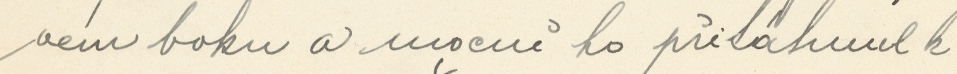vém boku a mocně ho přitáhnul k
